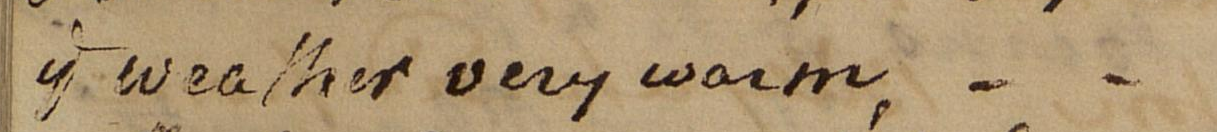y^e weather very warm--
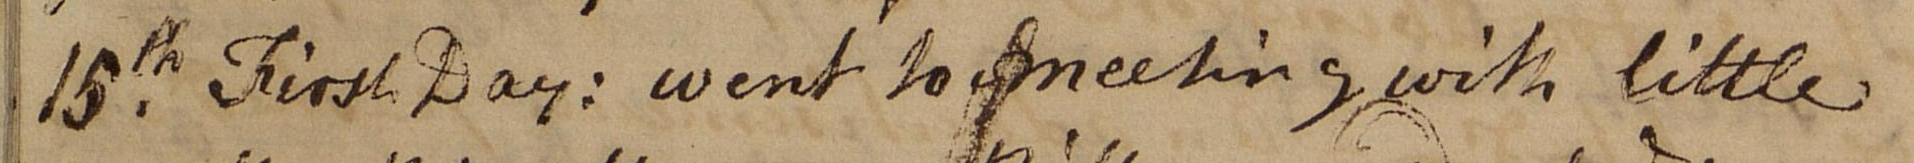15^th. First Day: went to meeting with little
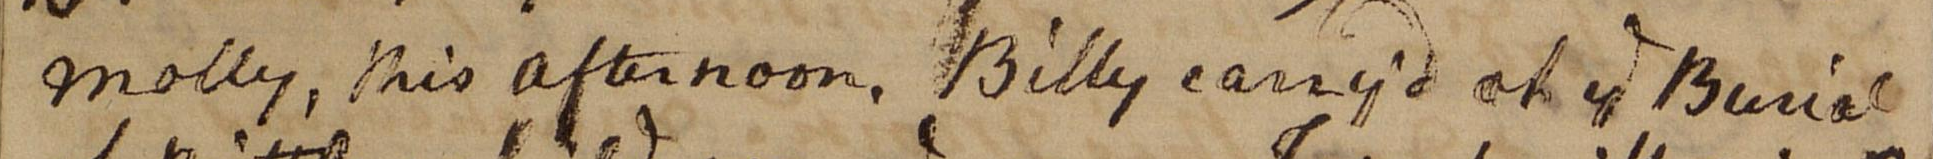Molly, this afternoon. Billy carry'd at y^e Burial
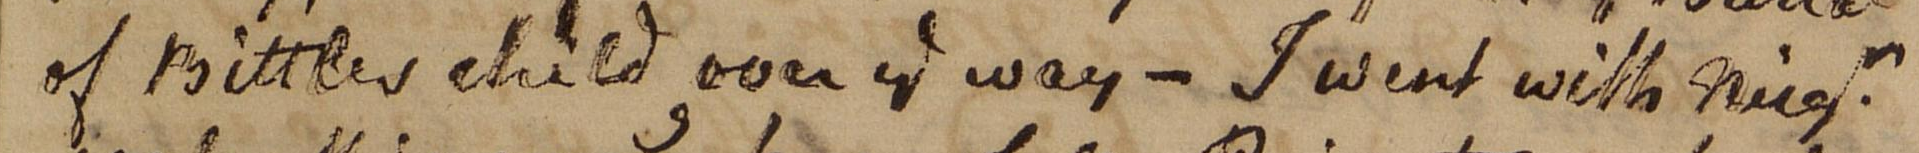of Bittles child over y^e way- I went with Neig^r.
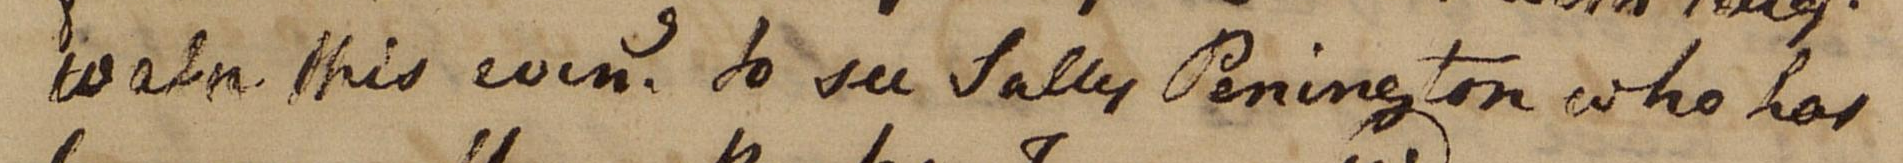Waln this even^g. to see Sally Penington who has
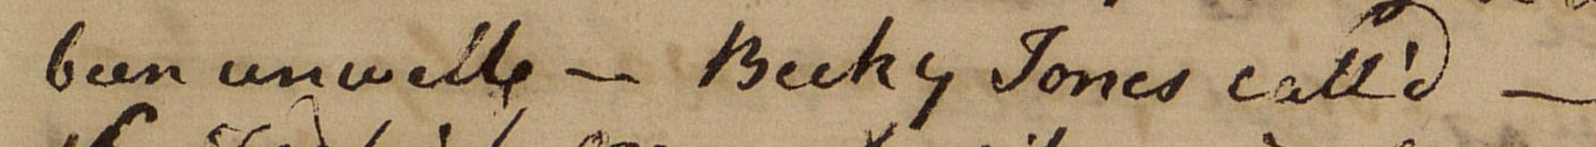been unwell- Becky Jones call'd-
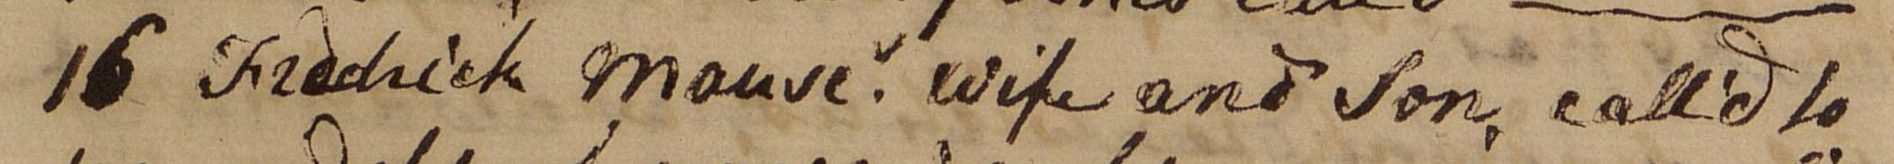16 Fredrick Mause^s. Wife and Son, call'd to
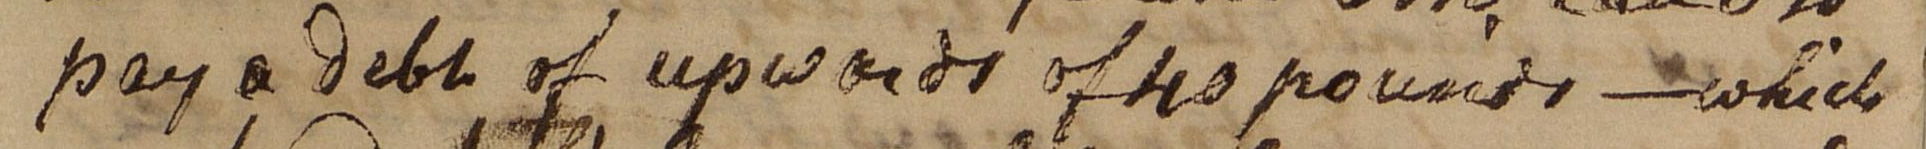pay a debt of upwards of 40 pounds- which
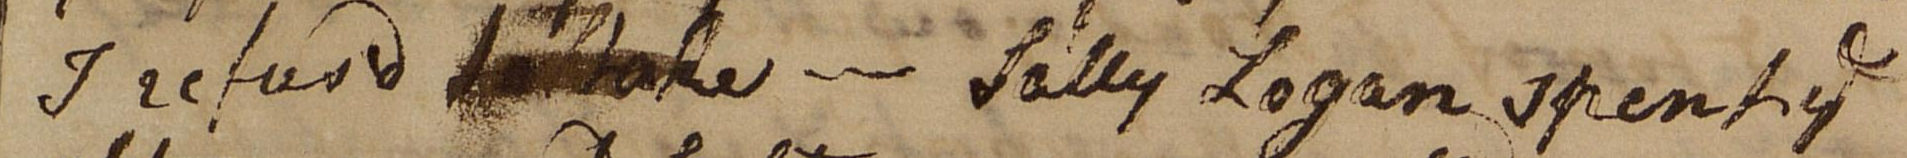I refus'd to take - Sally Logan spent y^e
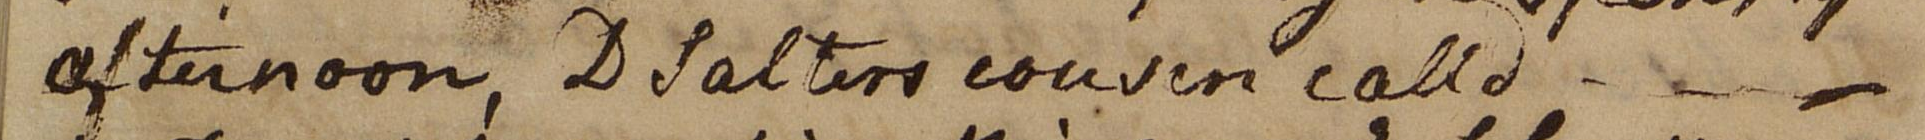afternoon, D Salters cousen calld--
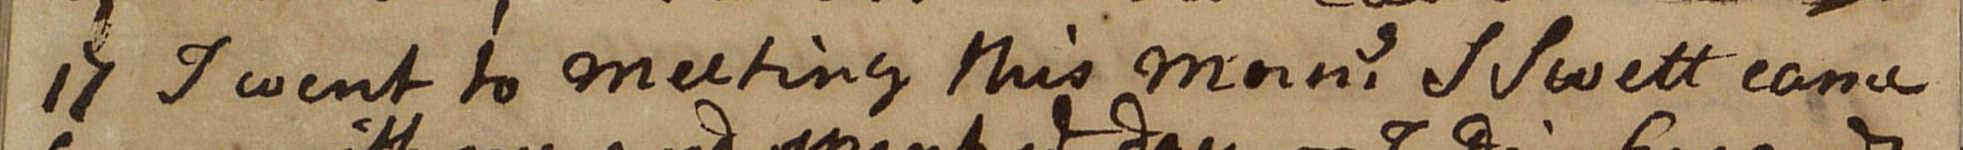17 I went to meeting this morn^g. S Swett came
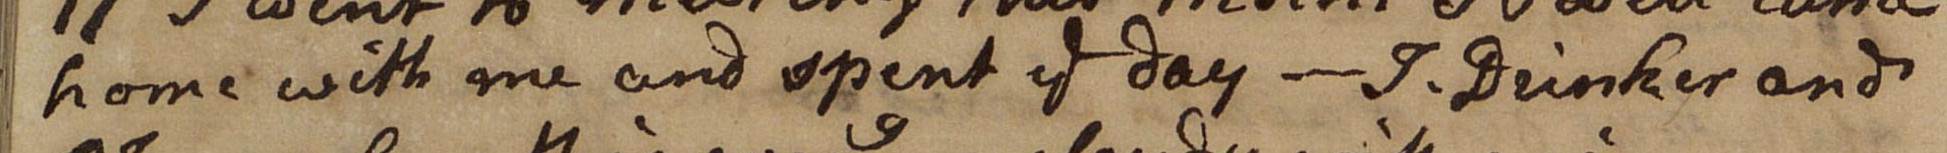home with me and spent y^e day- I. Drinker and
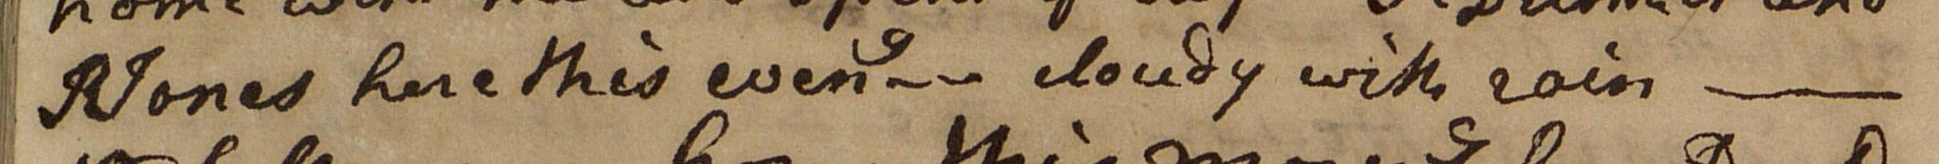S Jones here this even^g-- cloudy with rain-
